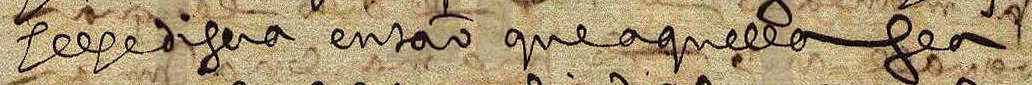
he lhe disera entaõ que aquella sea
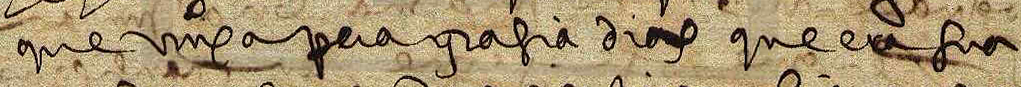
que vinha pera grasia dias que era sua
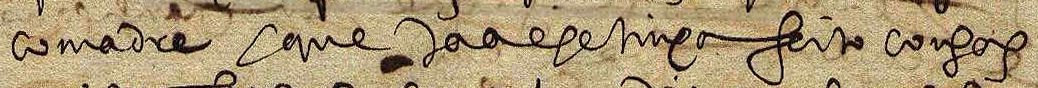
comadre E que Jaa lhe tinha feito cousas
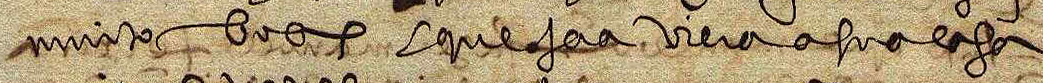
muito boas E que Jaaa viera a sua casa
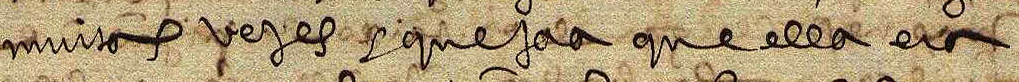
muitas veses E que Jaa que ella era
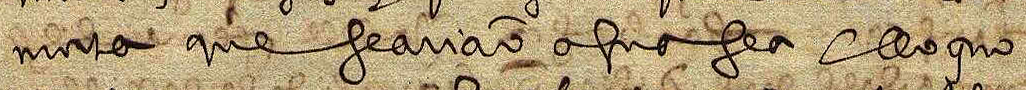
morta que seariaõ a sua sea E lloguo
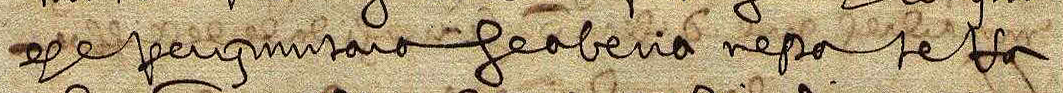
lhe pergumtara se aberia nesta teRa
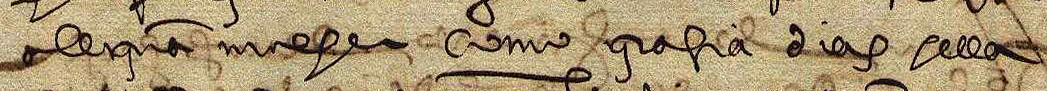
allguā molher como grasia dias e ella
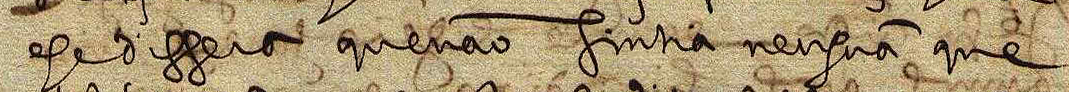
lhe dissera que não sintia nenhuā que
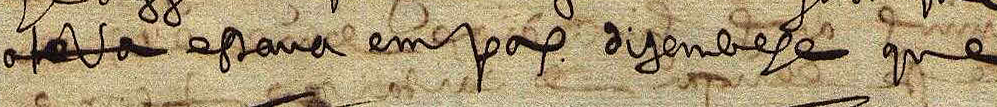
_ estaua em pas. dizendolhe que
